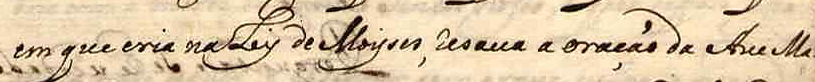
em que cria a Ley de Moyses, resaua a oração da Aue Ma
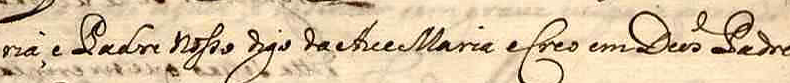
ria, e Padre nosso digo da Aue Maria e Creo em Deos Padre
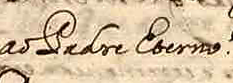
ao Padre Eterno.
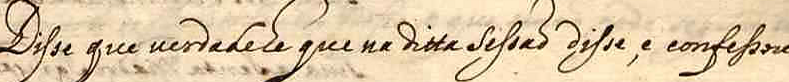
Disse que verdade he que na ditta sessaõ disse, e confessou
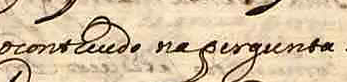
o contheudo na pergunta.
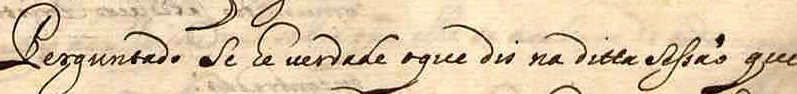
Perguntado se he verdade o que dis na ditta sessão que
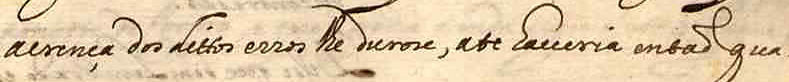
a crença dos dittos erros lhe durou, ate haueria então qua
